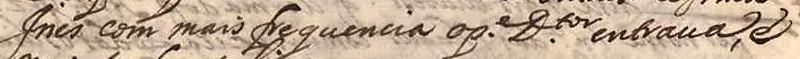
Jnes com mais frequencia o p.e D.or entraua, e
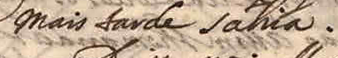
mais tarde sahia.
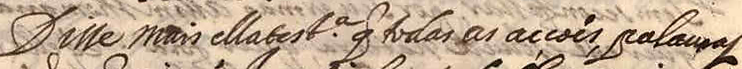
Disse mais ella test.a q̄ todas as acçoẽs, palauras
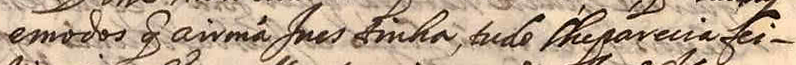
e modos q̄ a irmā Jnes tinha, tudo lhe parecia fei
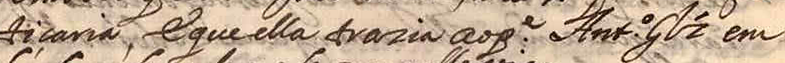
tiçaria, E que ella trazia ao pe Ant.o Glz̄ em
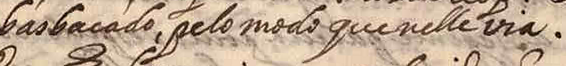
basbacado, pelo modo que nelle via.
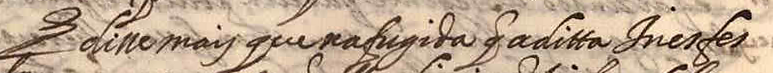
E disse mais que na fugida q̄ a ditta Jnes fes
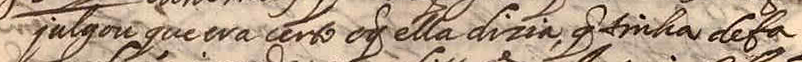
julgou que era certo o q̄ ella dizia, q̄ tinha de fa
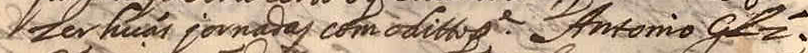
zer huās jornadas com o ditto p.e Antonio Glz̄.
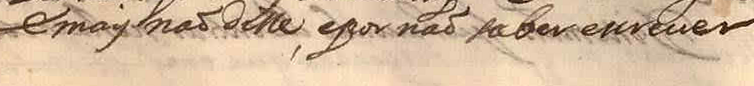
E mais naõ disse, e por naõ saber escreuer
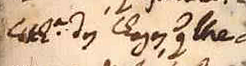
Cath.a das Chagas, q̄ lhe
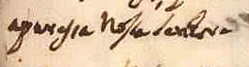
aparesia Nossa Senhora
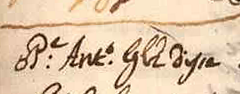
o P.e Ant.o Glz̄ disia
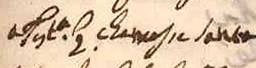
a Test.a q̄ chamasse santa
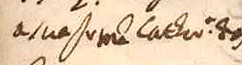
a sua Jrmā Cather.a das
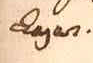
chagas.
